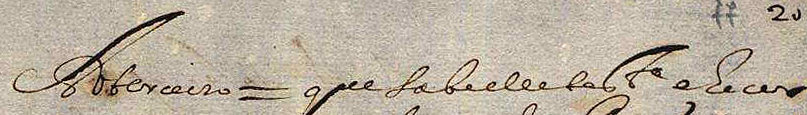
Ao terceiro = que sabe elle testa e he cer
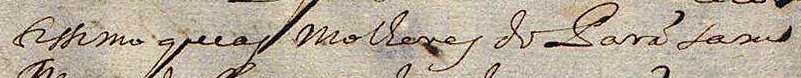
tissimo que as molheres do Pará sam
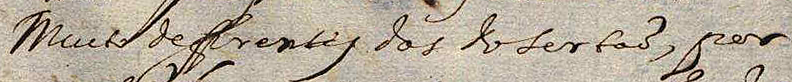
Muito deffrentes das do sertaõ, por
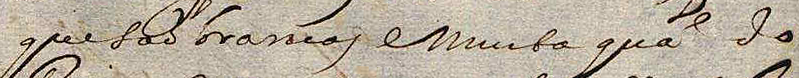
que saõ brancas e muito qua do
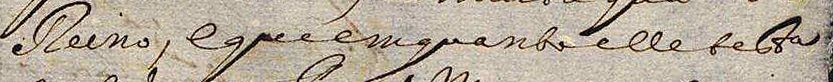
Reino, e que emquanto elle testa
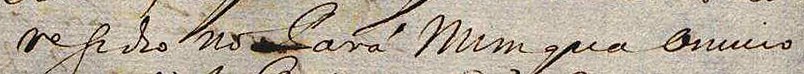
residio no Pará Numqua ouuio
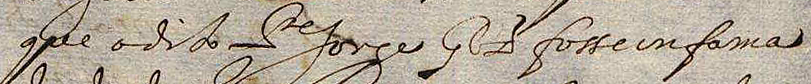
que o dito Pe Jorge Glz̄ fosse infama
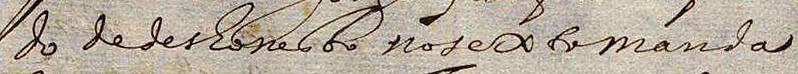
do de deshonesto no sexto manda
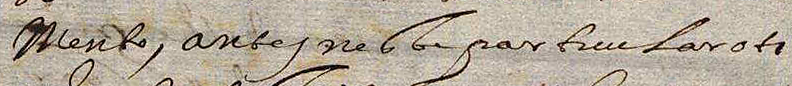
mento, antes neste particular o ti
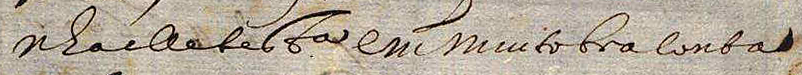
nha elle test.a em muito boa conta
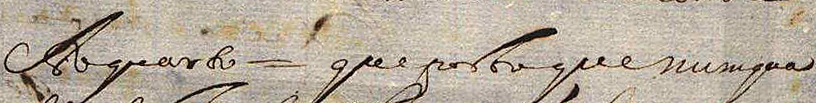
Ao quarto = que posto que numqua
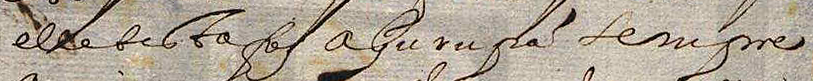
elle testa foj a Gurupā sempre
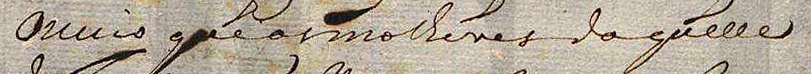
ouuio que as molheres daquelle
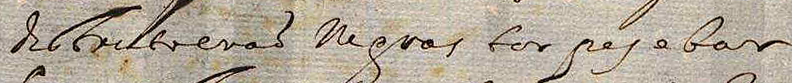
districto eraõ negras torpes e bar
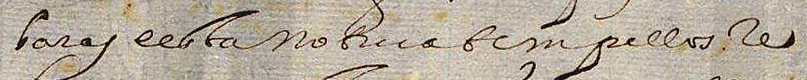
baras e esta noticia tem pellos Re
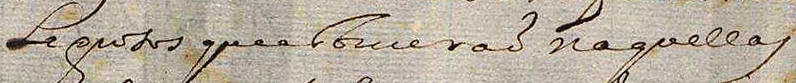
Ligiosos que estiueraõ naquellas
